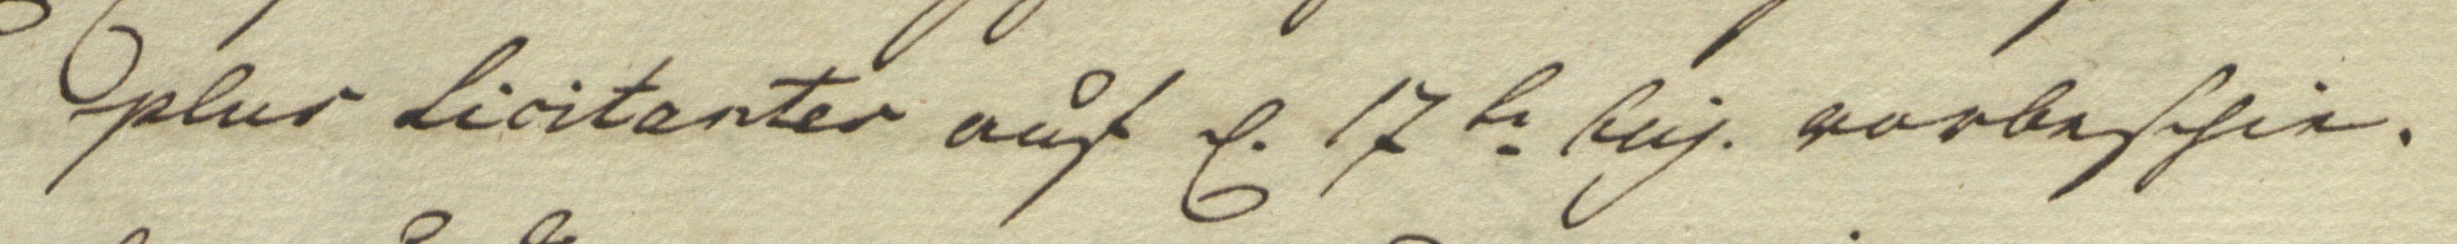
plus Licitantes auf d. 17 ten huj. vorbeschie¬
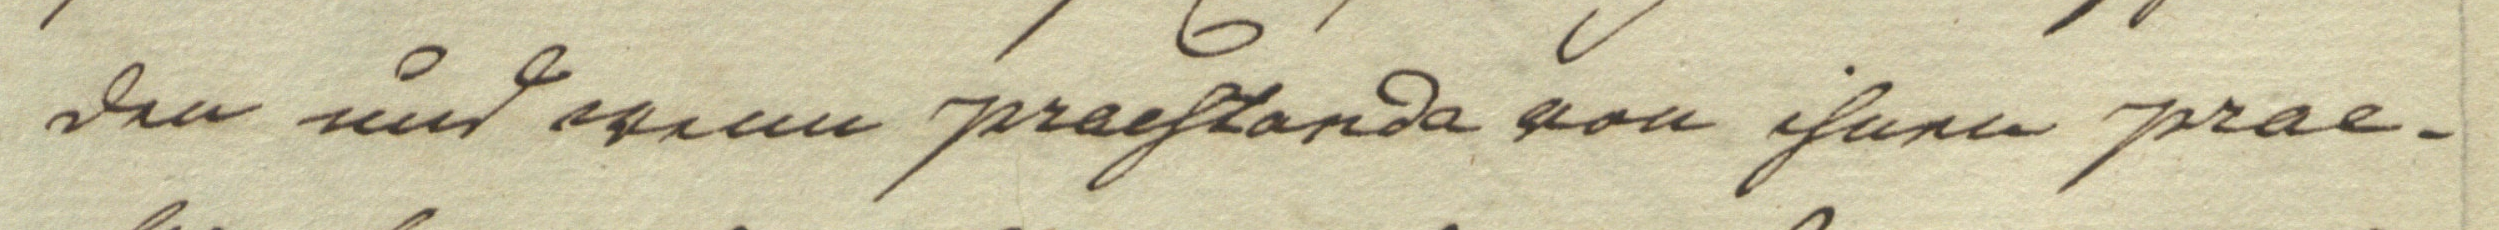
den und wenn praestanda von ihnen prae¬
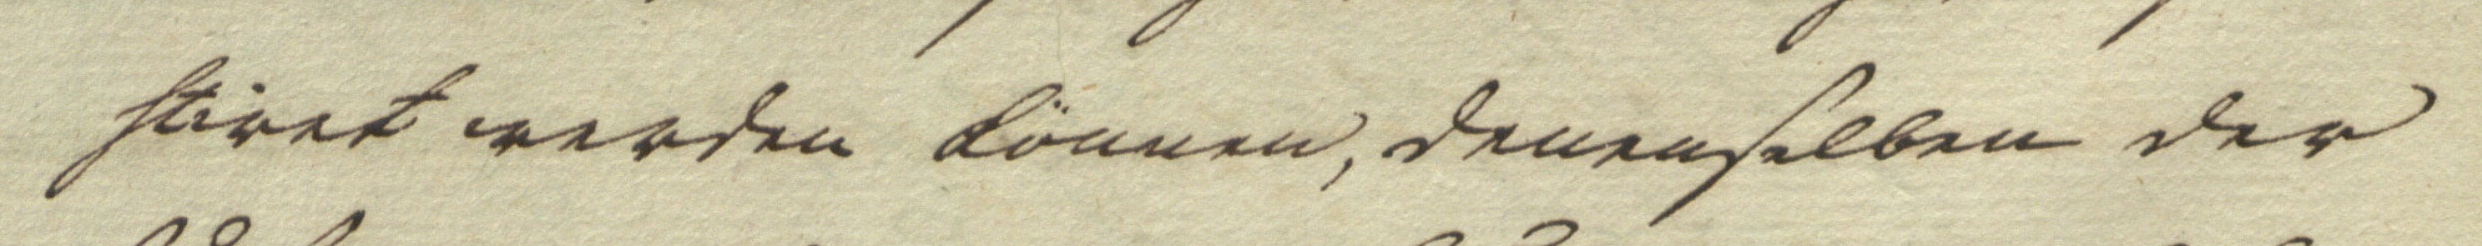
stiret werden können, denenselben der
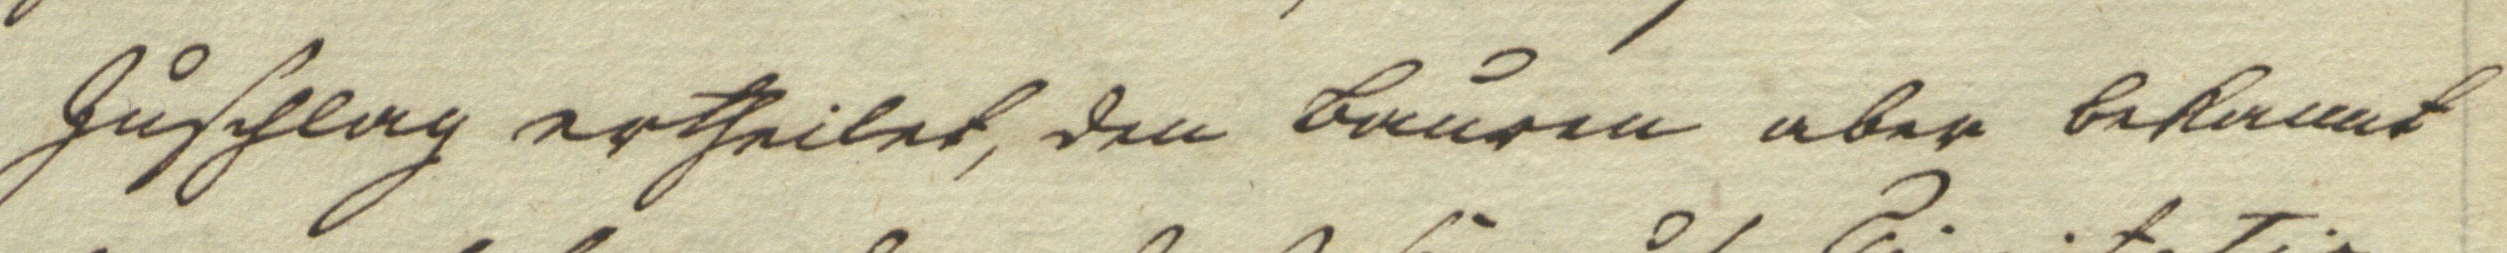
Zuschlag ertheilet, den Bauren aber bekannt
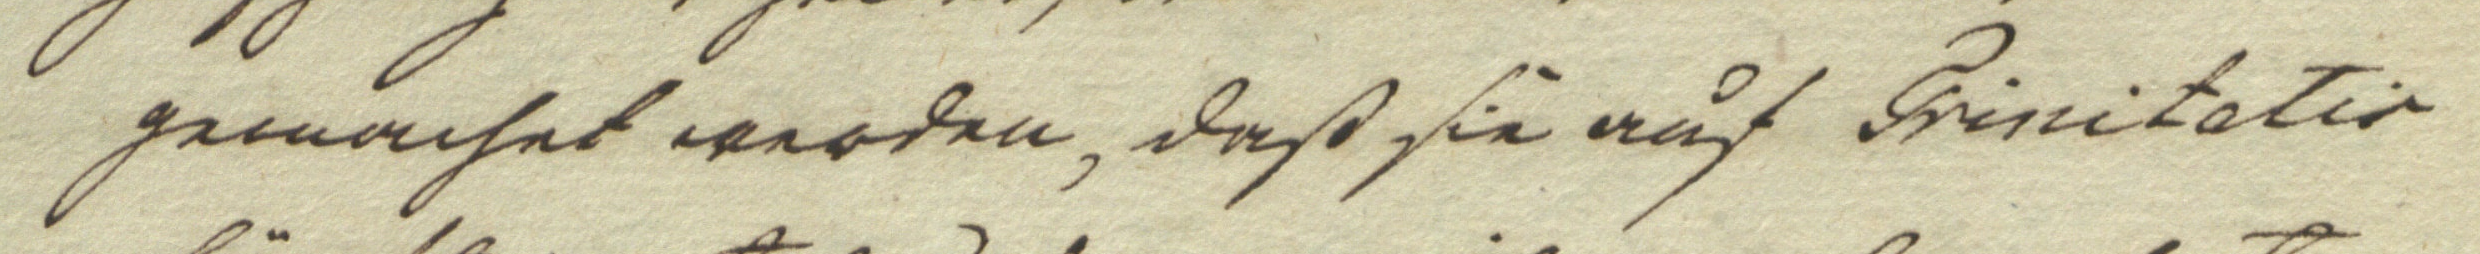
gemachet werden, daß sie auf Trinitatis
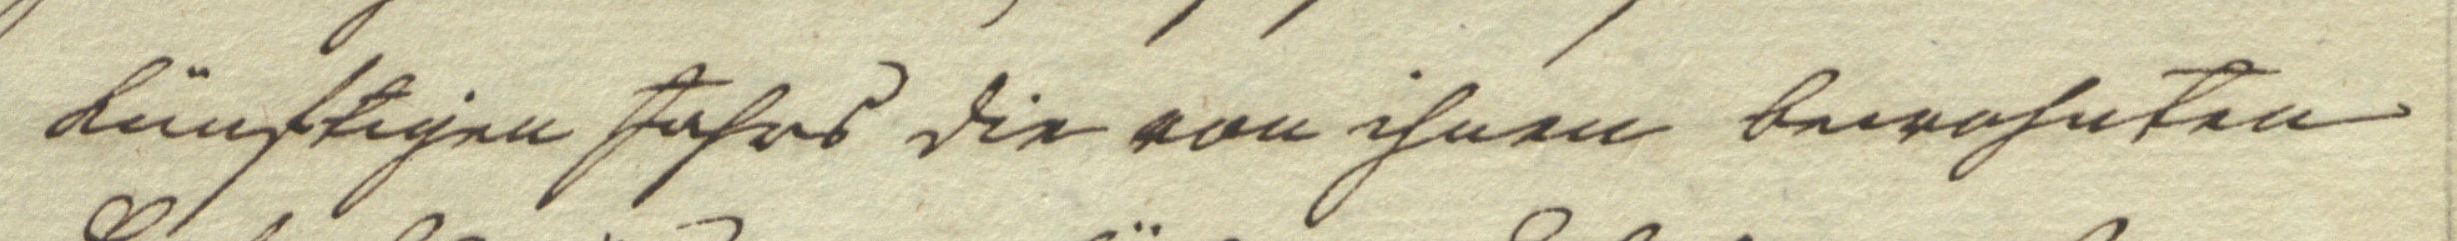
künftigen Jahres die von ihnen bewohnten
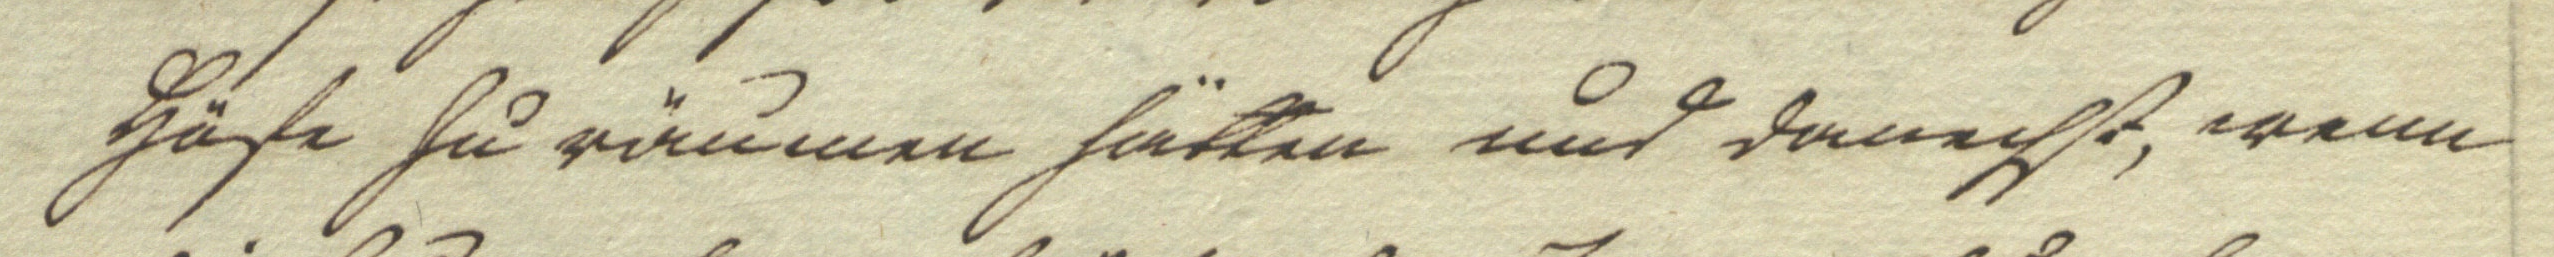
Höfe zu räumen hätten und danechst, wenn
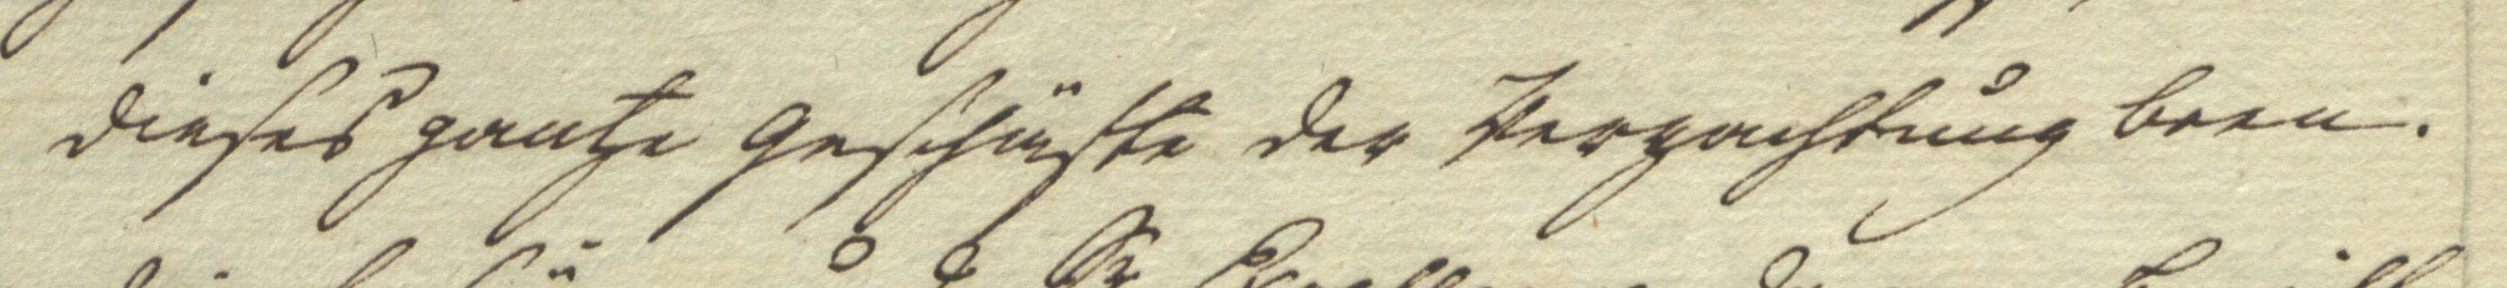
dieses gantze Geschäfte der Verpachtung been¬
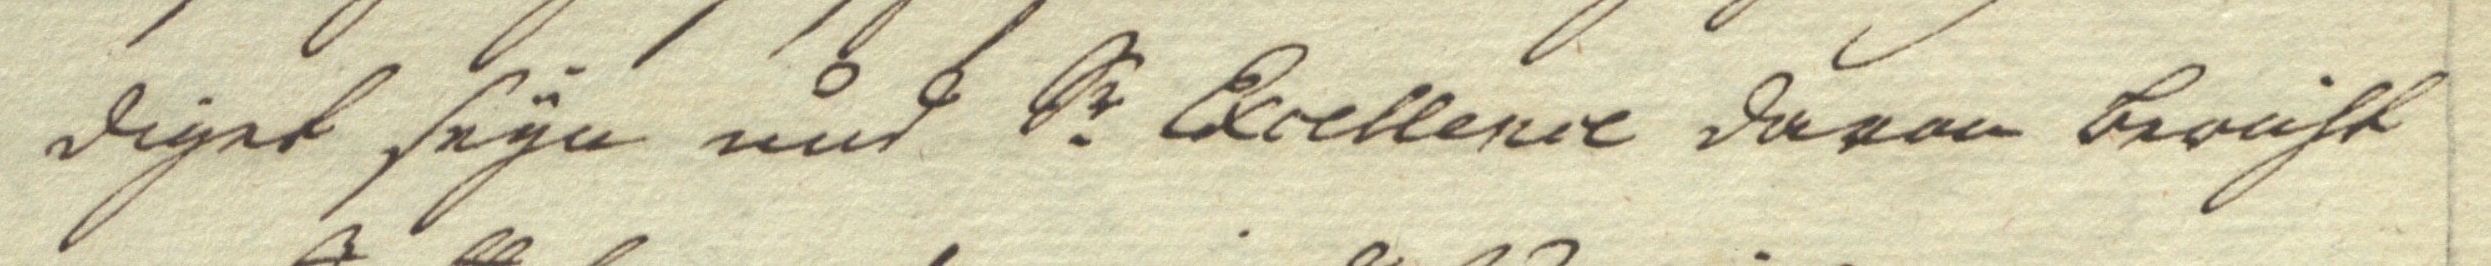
diget seÿn und Sr Excellence davon Bericht
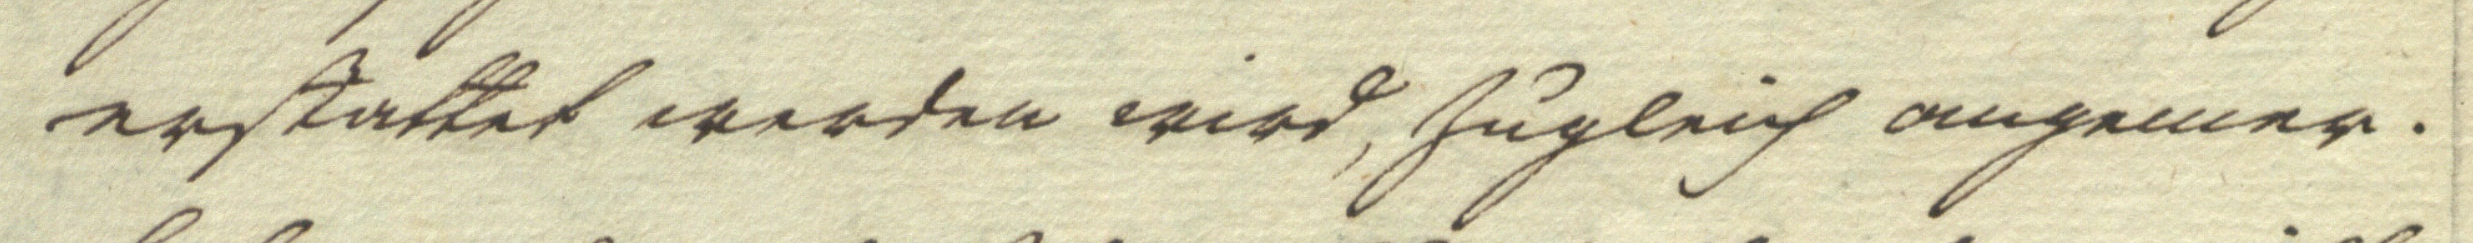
erstattet werden wird, zugleich angemer¬
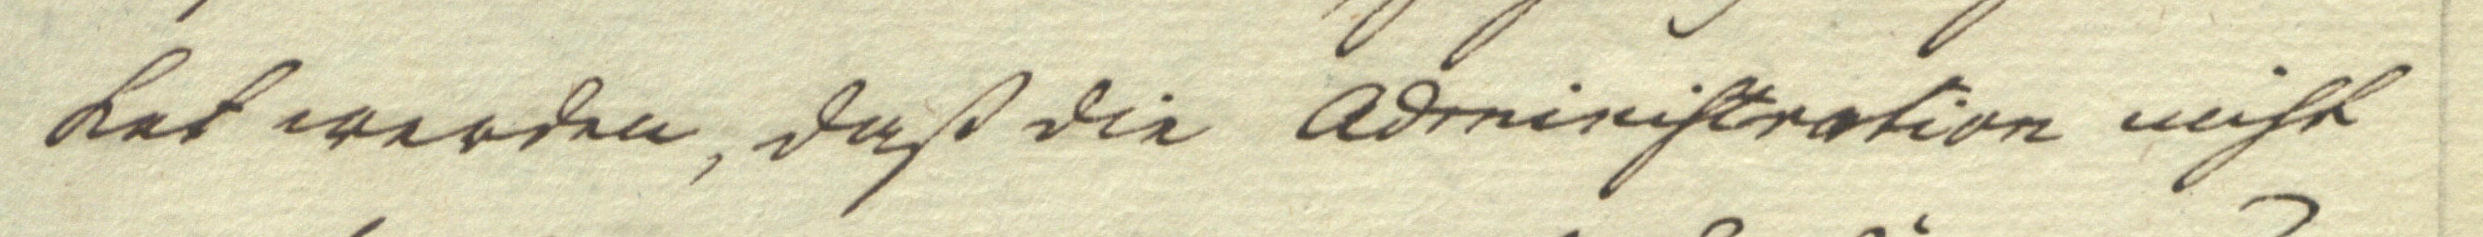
ket werden, daß die Administration nicht
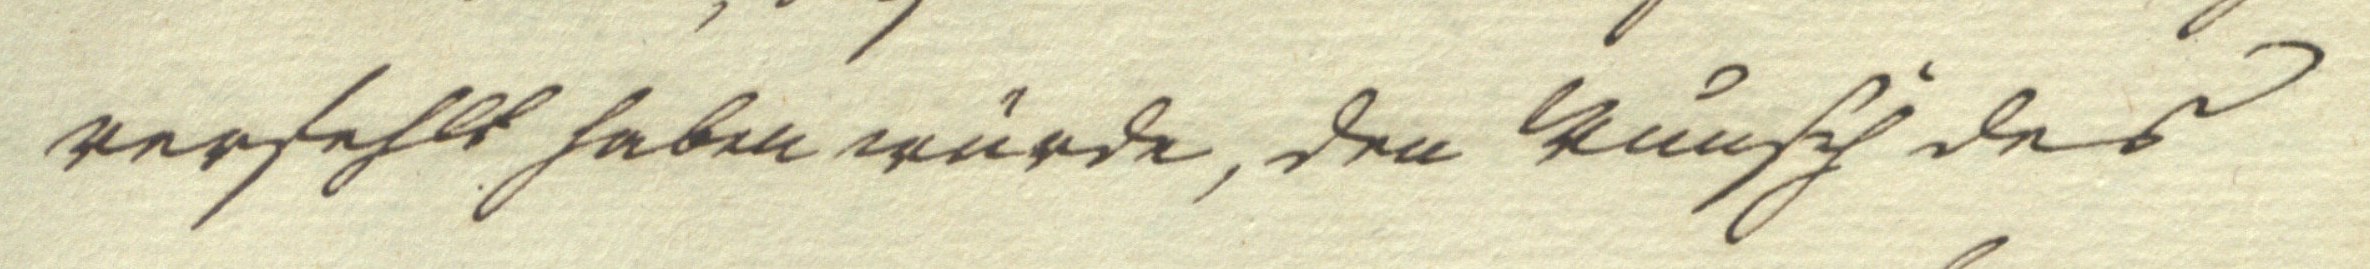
verfehlt haben würde, den Wunsch des
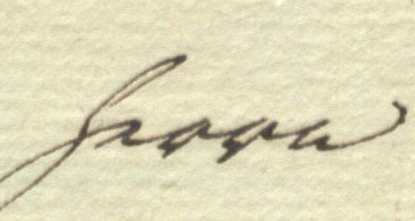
Herrn
